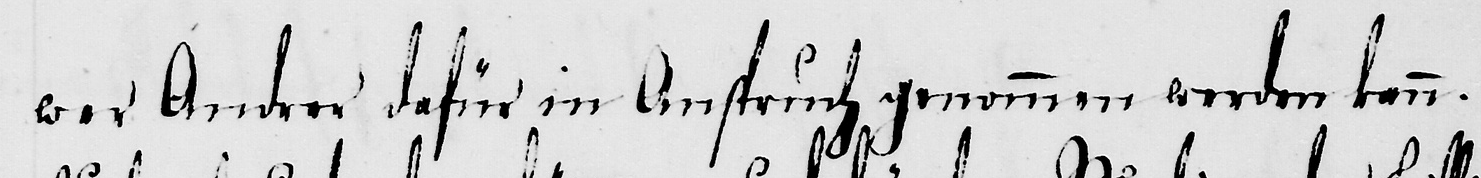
wer Andrer dafür in Anspruch genommen werden kann.
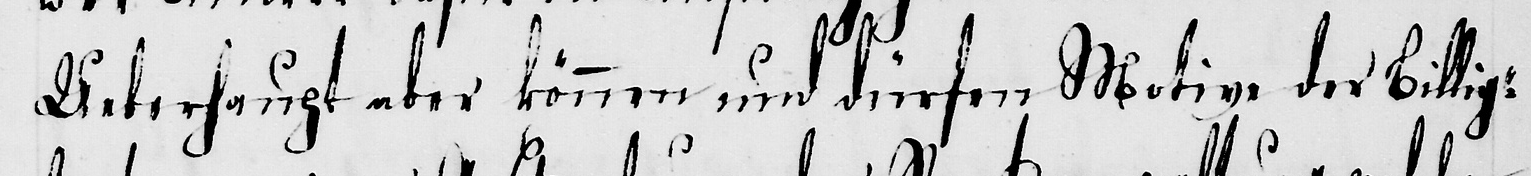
Ueberhaupt aber können und dürfen Motive der Billig¬
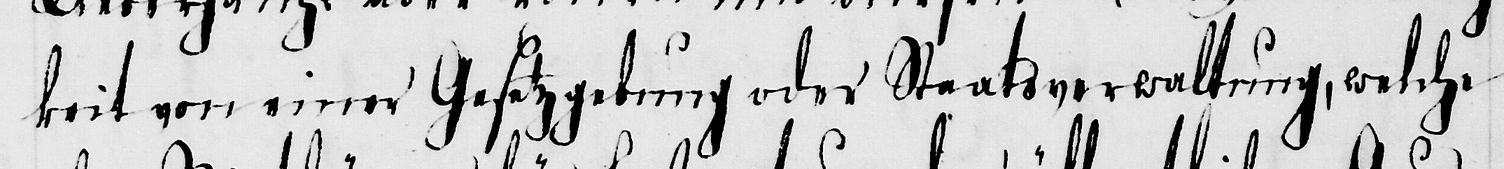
keit von einer Gesetzgebung oder Staatsverwaltung, welche
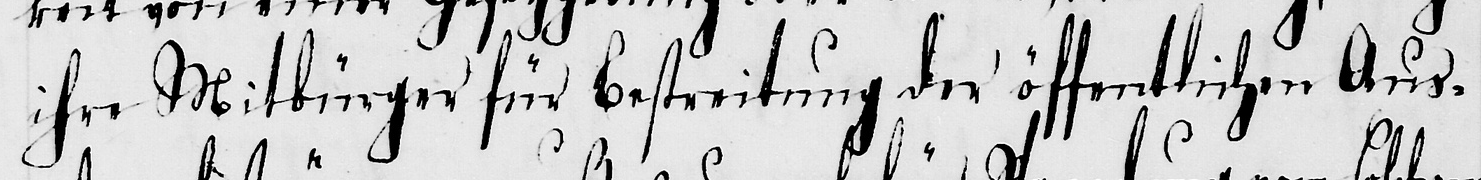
ihre Mitbürger für Bestreitung der öffentlichen Aus¬
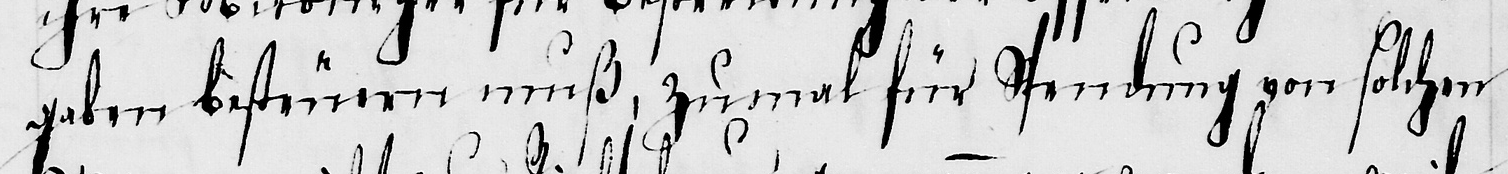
gaben besteuern muß, zumal für Spendung von solchen
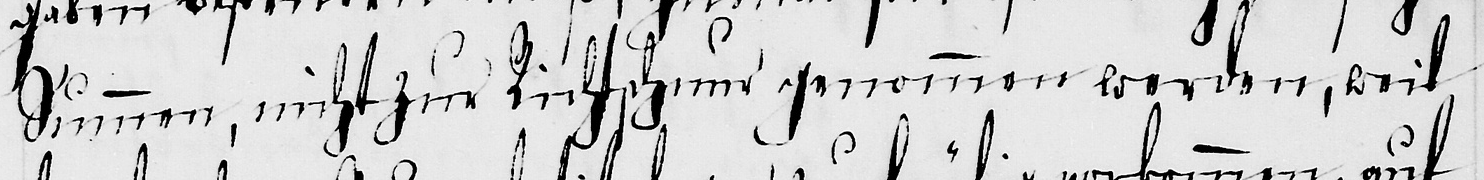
Summen, nicht zur Richtschnur genommen werden, weil
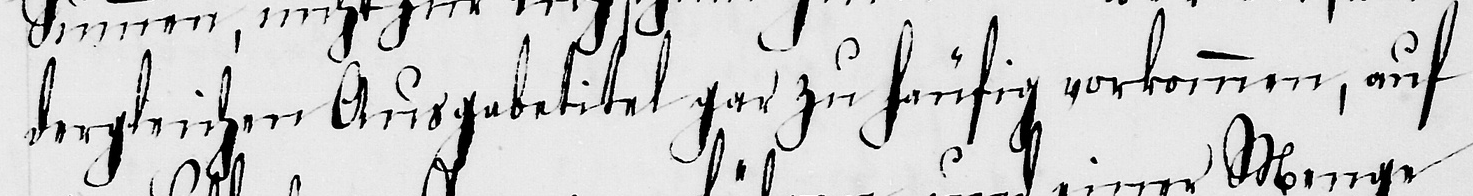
dergleichen Ausgabetitel gar zu häufig vorkommen, auf
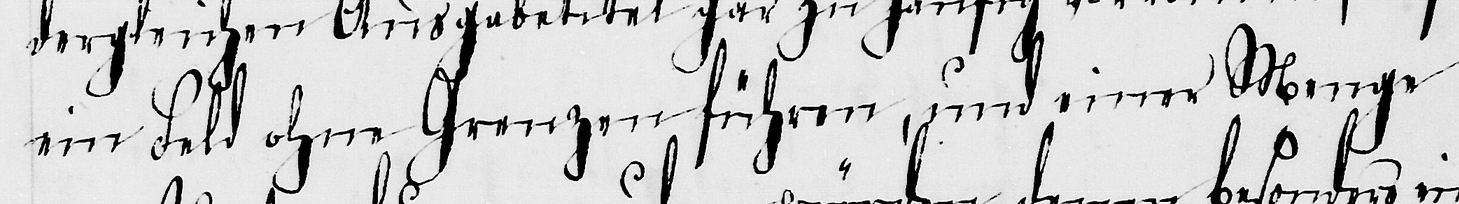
ein Feld ohne Grenzen führen, und einer Menge
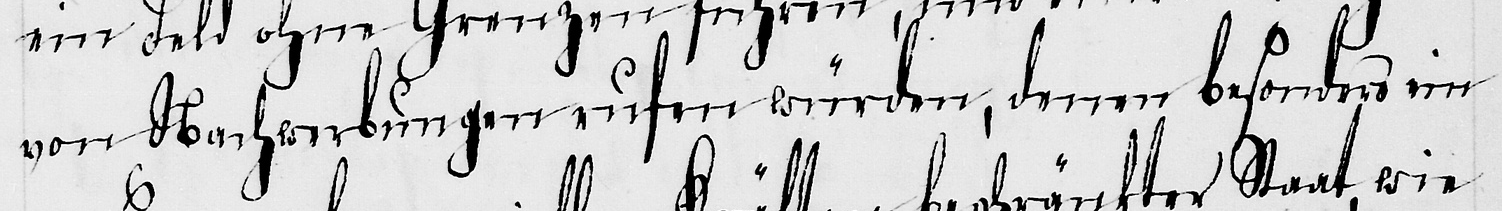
von Nachwerbungen rufen würden, denen besonders ein
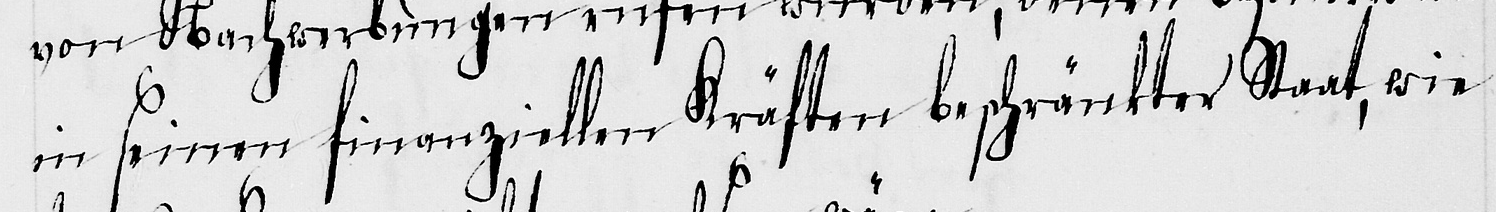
in seinen finanziellen Kräften beschränkter Staat, wie
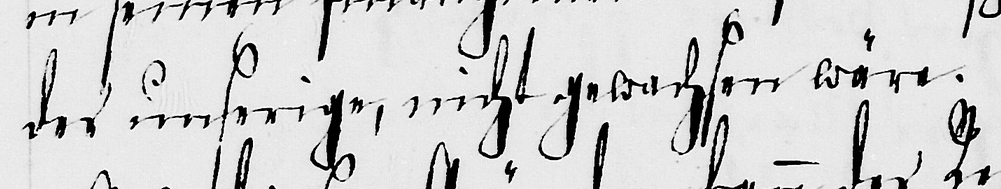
der unserige, nicht gewachsen wäre.
